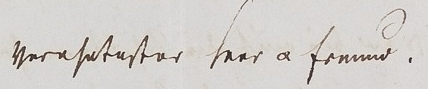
Verehrtester Herr & Freund
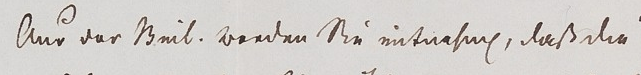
Aus der Beil. werden Sie entnehmen, daß die
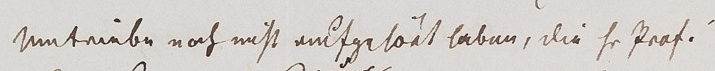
Umtriebe noch nicht aufgehört haben, die Hr Prof.
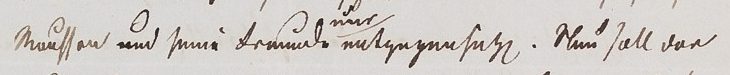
Mousson um seine Freunde uns entgegensetzen. Nun soll der
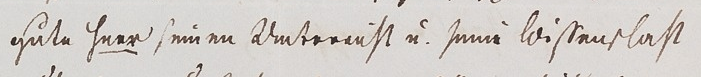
gute Heer seinen Unterricht u. seine Wissenschaft
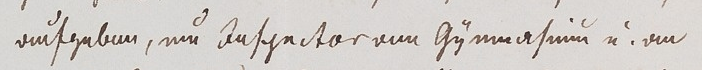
aufgeben, um Inspector am Gymnasium u. an
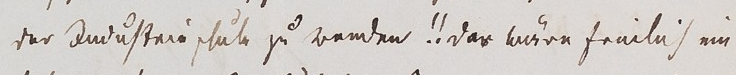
der Industrieschule zu werden!! Das wäre freilich ein
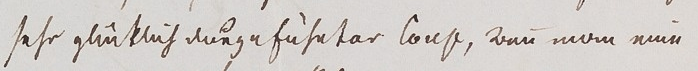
sehr glücklich ausgeführter Coup, wenn man eine
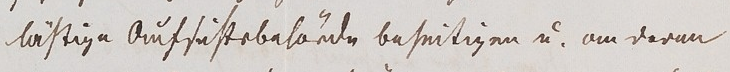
lästige Aufsichtsbehörde beseitigen u. an deren
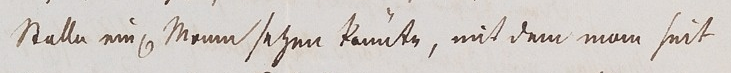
Stelle einen Mann setzen könnte, mit dem man seit
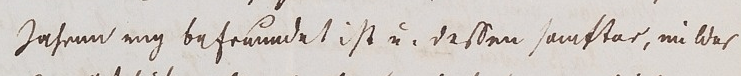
Jahren eng befreundet ist u. dessen sanftes, mildes
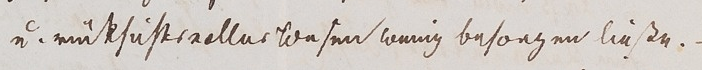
u. rücksichtsvolles Wesen wenig besorgen ließe. –
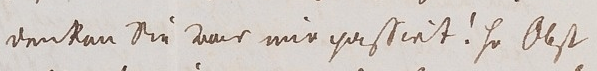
Denken Sie was mir passiert! Hr. Obst
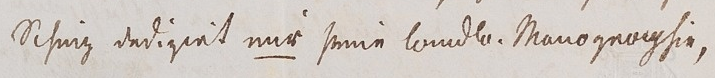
Schinz dediziert mir seine landw. Monographie,
